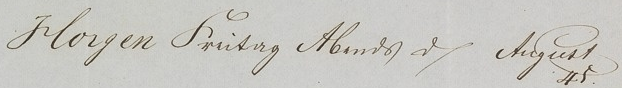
Horgen Freitag Abends den August
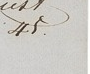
45.
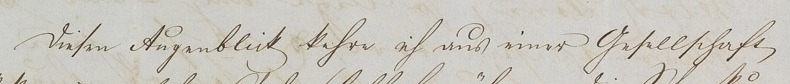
Diesen Augenblick kehre ich aus einer Gesellschaft
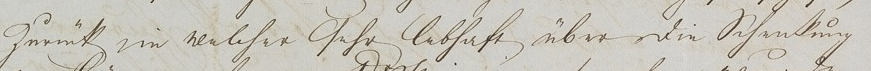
zurück, in welcher sehr lebhaft über die Schenkung
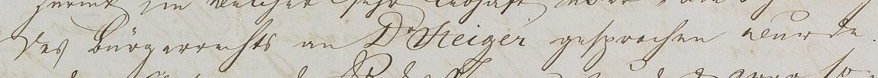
des Bürgerrechts an DrSteiger gesprochen wurde.
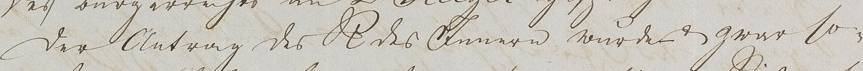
Der Antrag des R des Innern wurde– & zwar so-
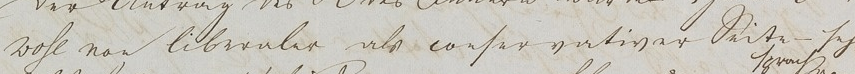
wohl von liberaler als conservativer Seite – sehr
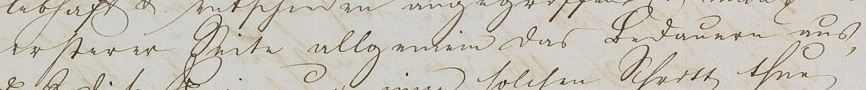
ersterer Seite allgemein das Bedauern aus,
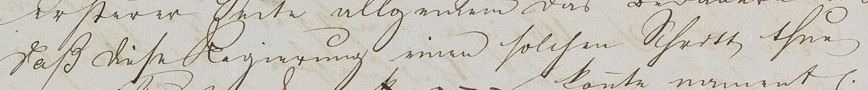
daß diese Regierung einen solchen Schritt thue,
